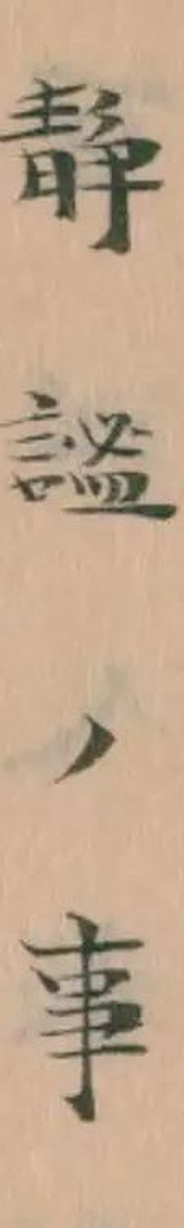静謐ノ事
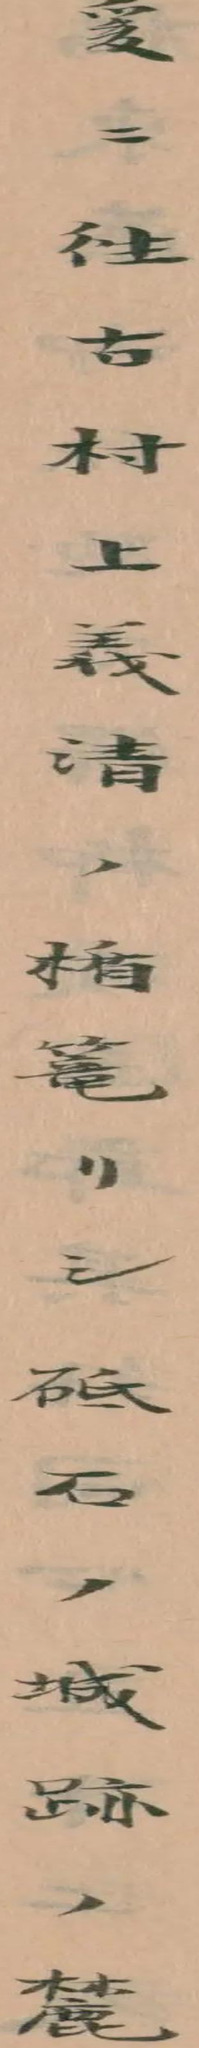爰二往古村上義清ノ楯篭リシ砥石ノ城跡ノ麓
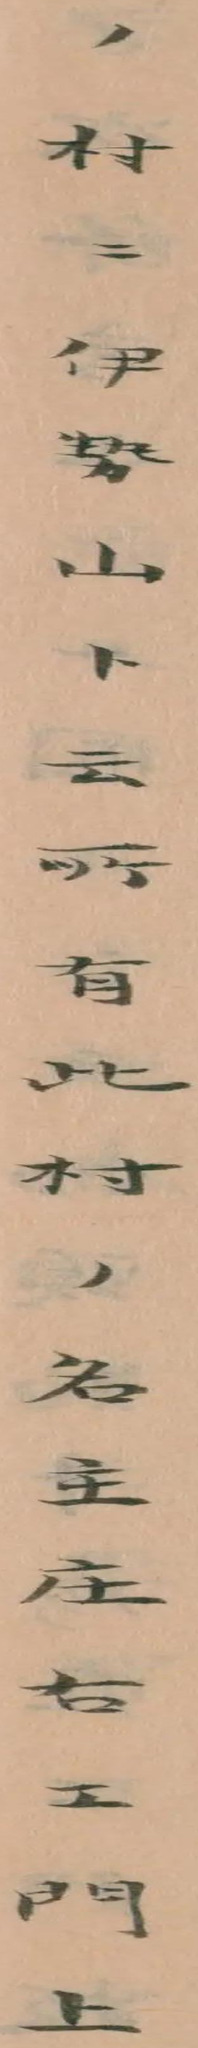ノ村二伊勢山ト云所有此村ノ名主庄右衛門上
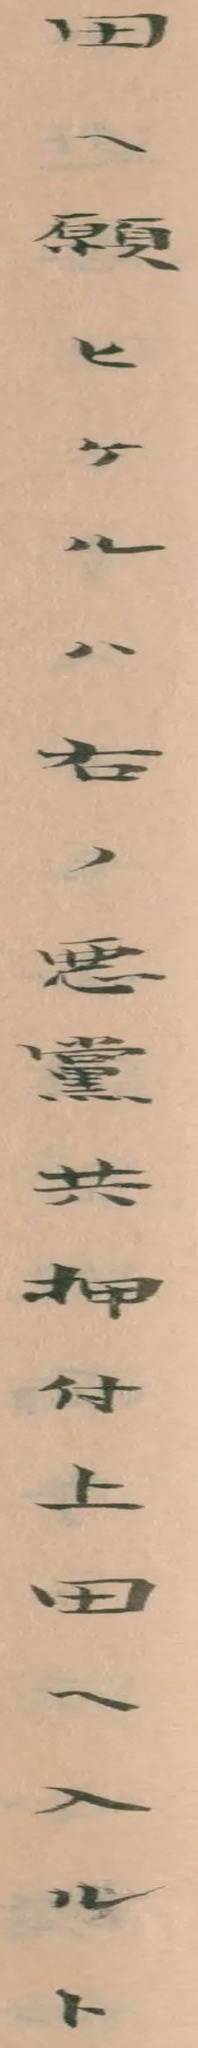田へ願ケルハ右ノ悪党共押付う上田へ入ルト
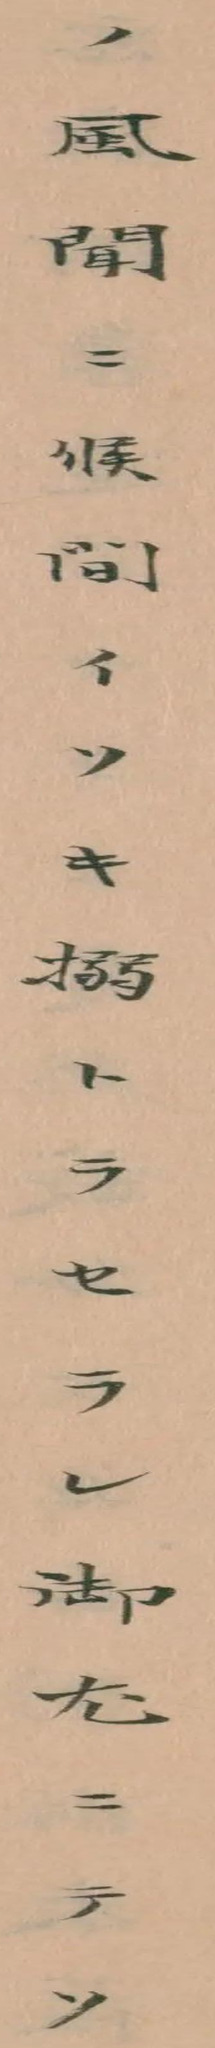ノ風聞二候間イソキ搦トラセラレ御尤二テソ
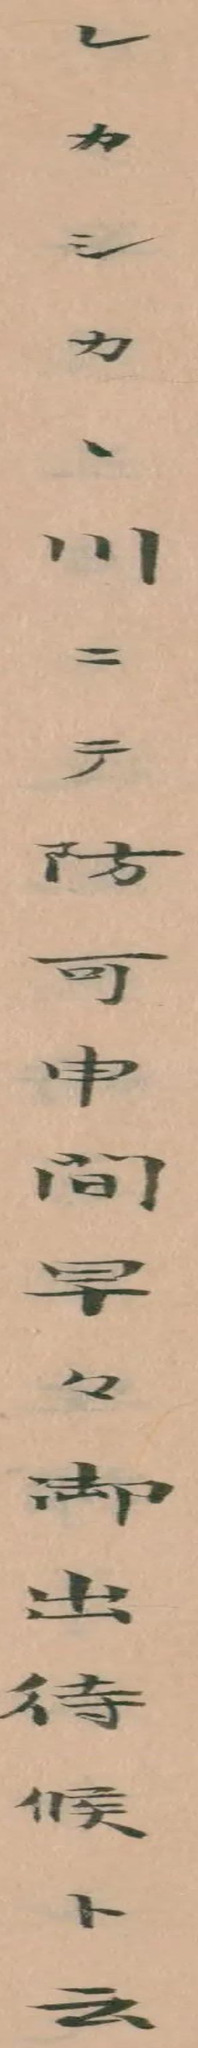レカシカゝ川二テ防可申間早々御出待候ト云
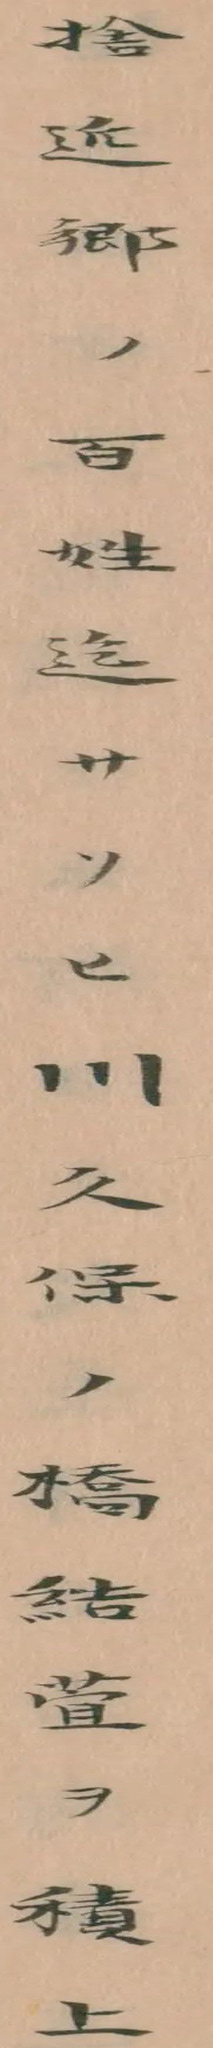捨近郷ノ百姓迄サソヒ川久保ノ橋結萱ヲ積上
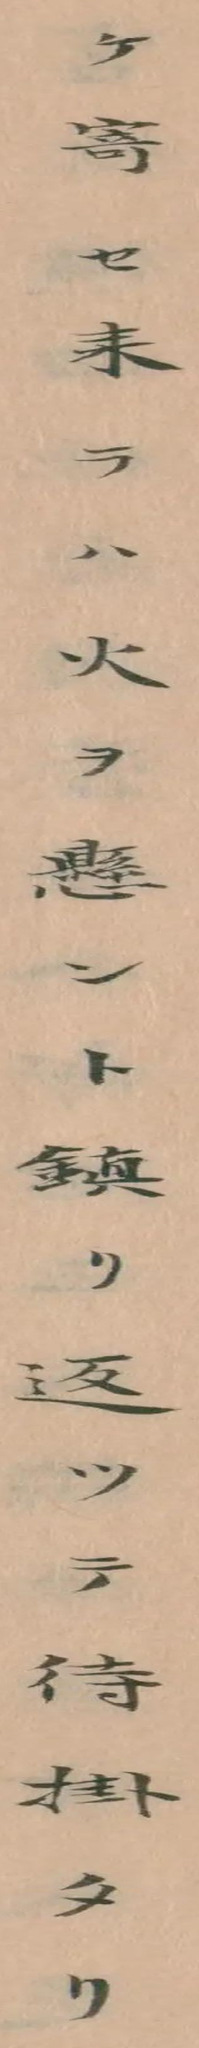ケ寄セ来ラハ火ヲ懸ント鎮り返ツテ待掛タリ
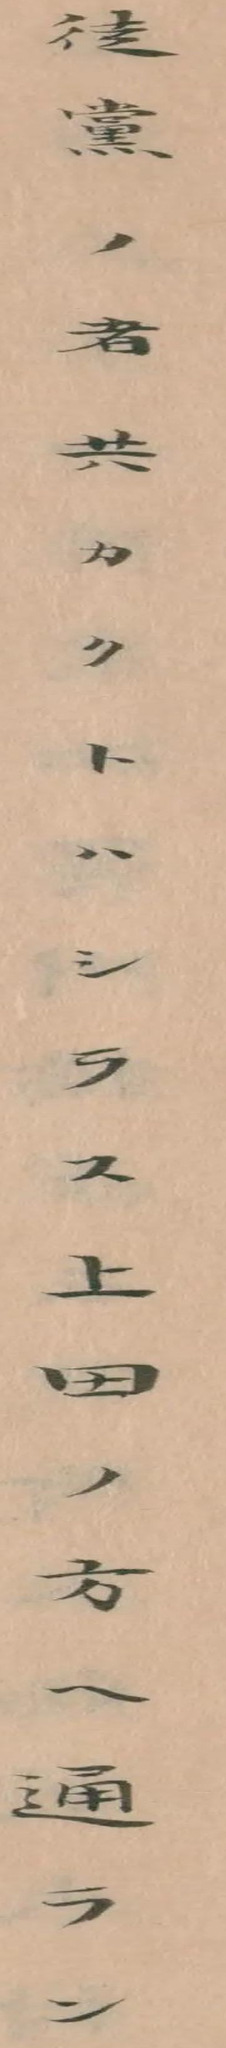徒党ノ者共カクトハシラス上田ノ方へ通ラン
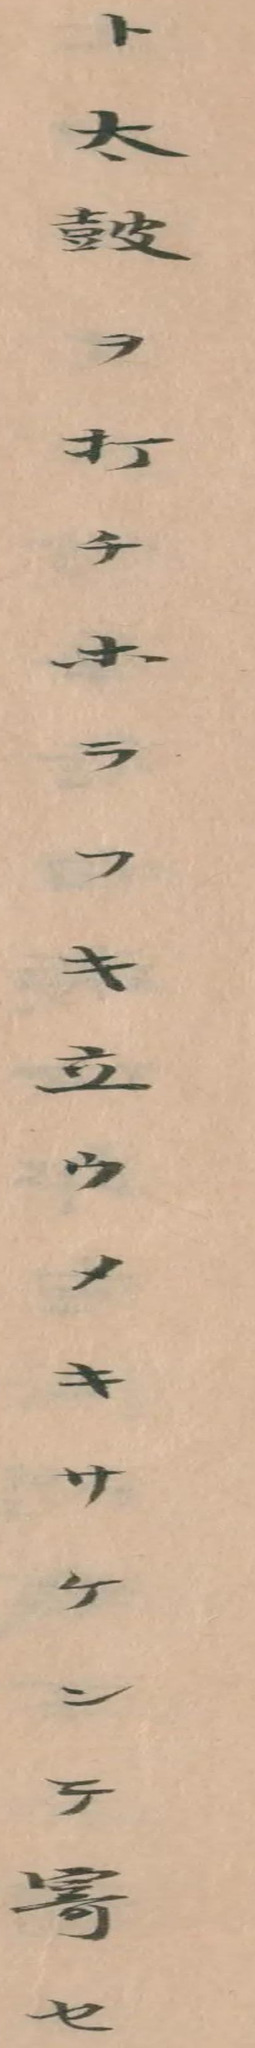ト太鼓ヲ打チホラフキ立ウメキサケンテ寄セ
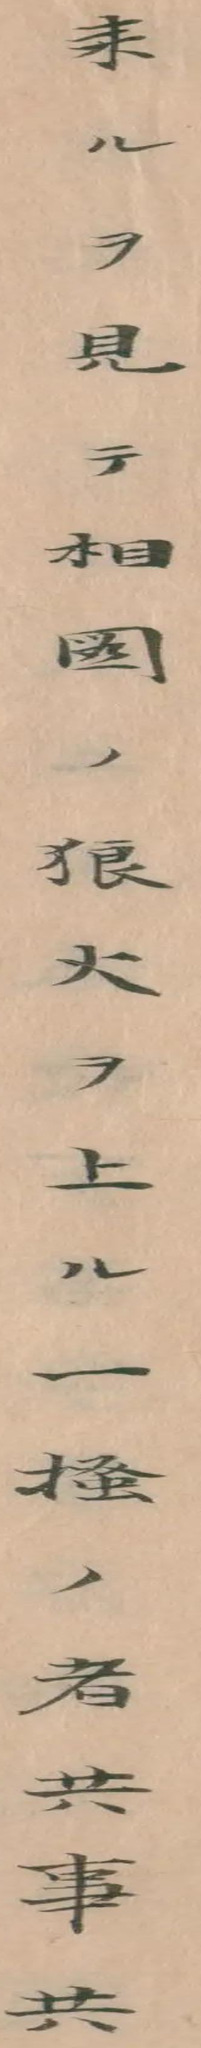来ルヲ見テ相図ノ狼火ヲ上ル一揆ノ者共事共
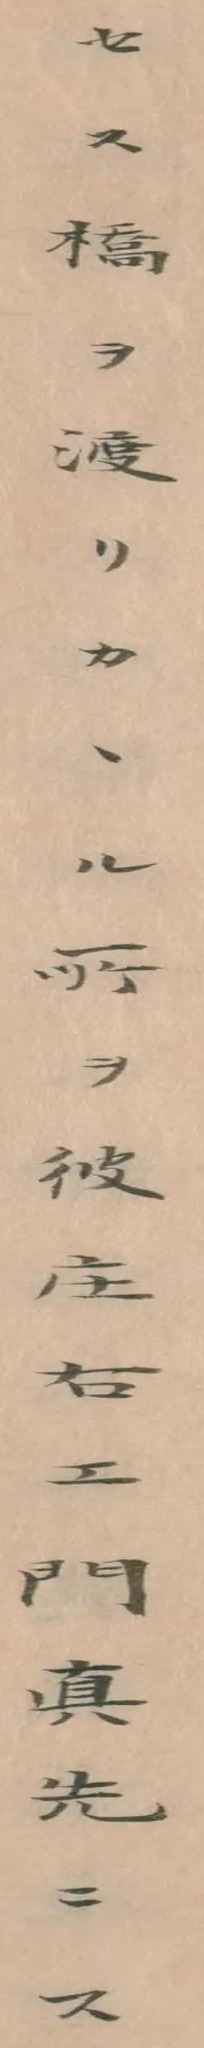セス橋ヲ渡りカゝル所ヲ彼庄右衛門真先二ス
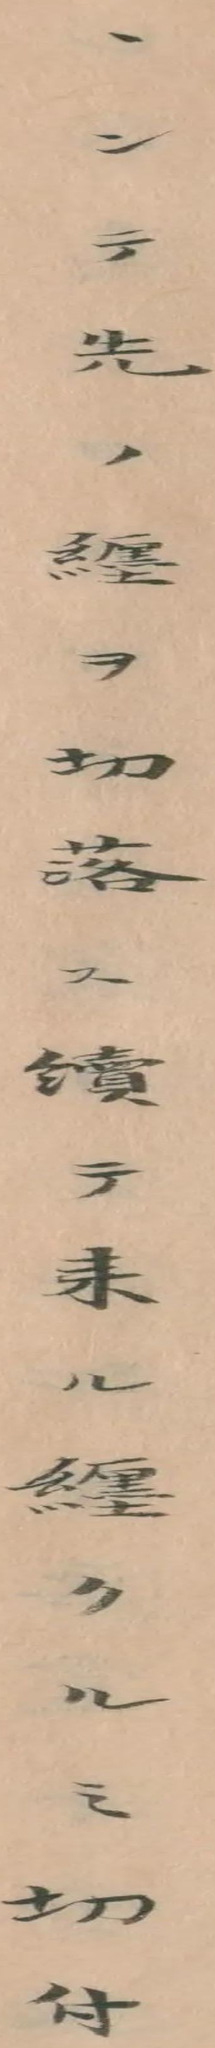ゝンテ先ノ纏ヲ切落ス続テ来ル纏クルミ切付

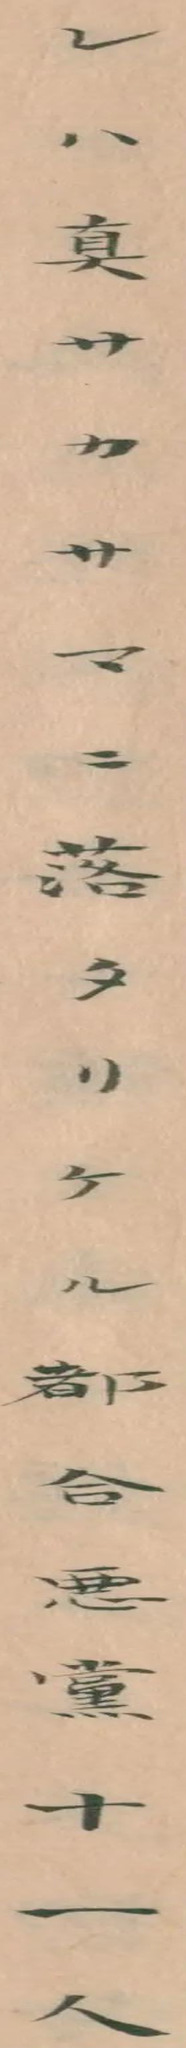レハ真サカサマ二落タりケル都合悪党十一人
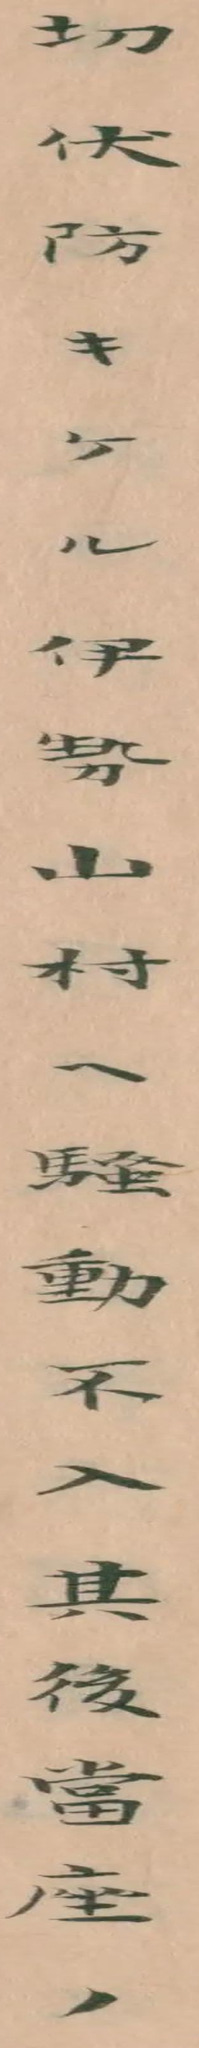切伏防キケル伊勢山村へ騒動不入其後当座ノ
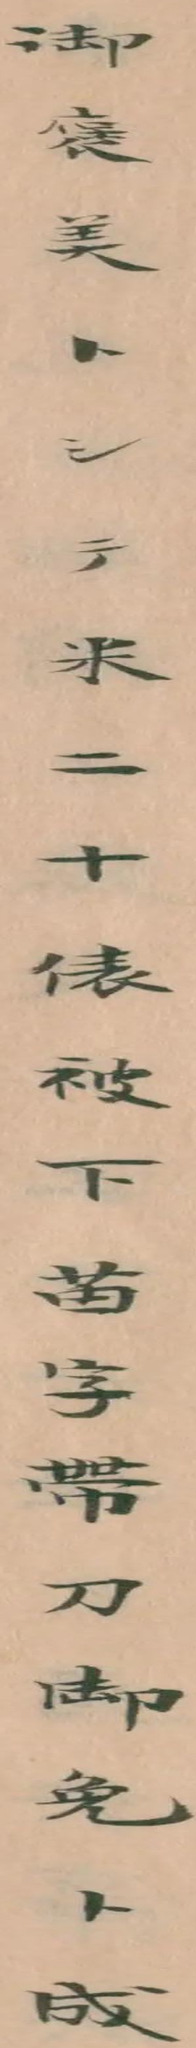御褒美トシテ米二十俵被下苗字帯刀御免ト成
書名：地災撮要. 巻3(地震之部)-巻4(噴火之部)
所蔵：国立国会図書館 National Diet Library, JAPAN
